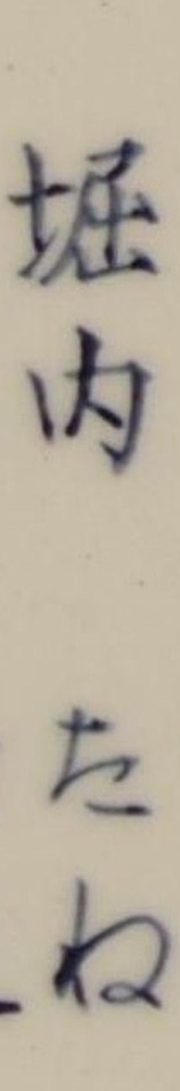堀内たね
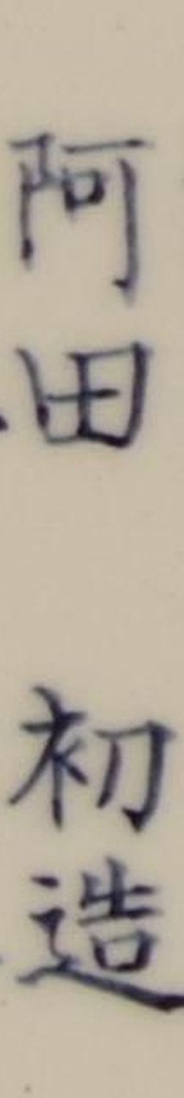阿田初造
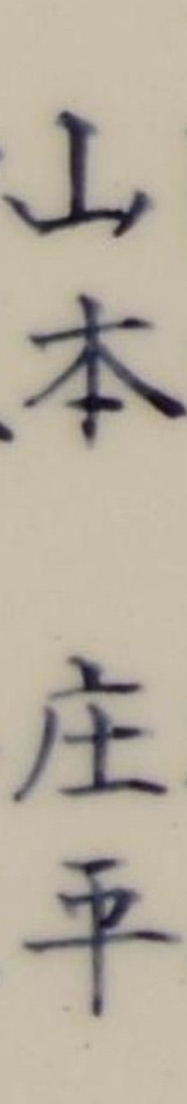山本庄平
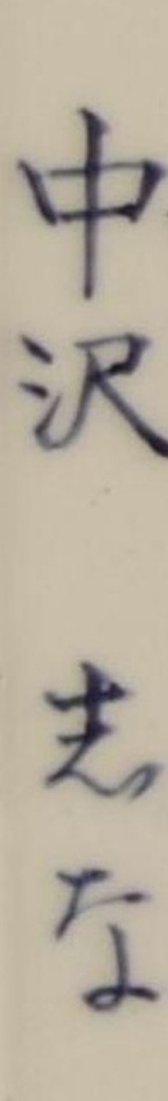中沢しな

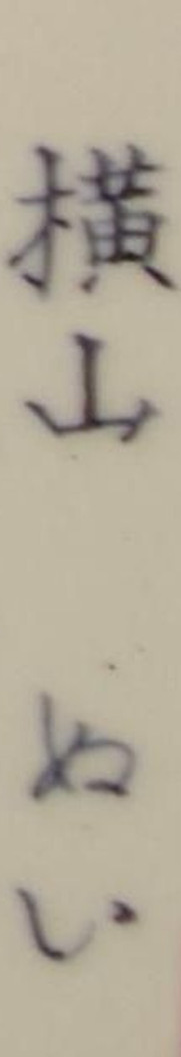横山ぬい
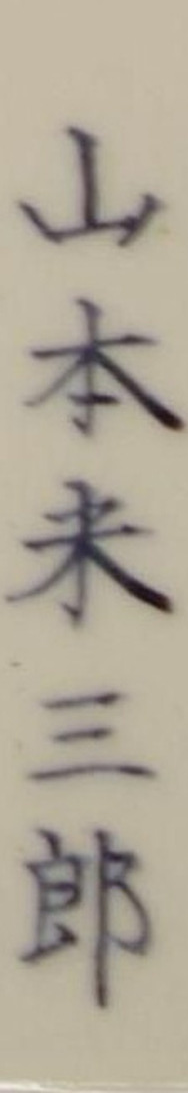山本米三郎
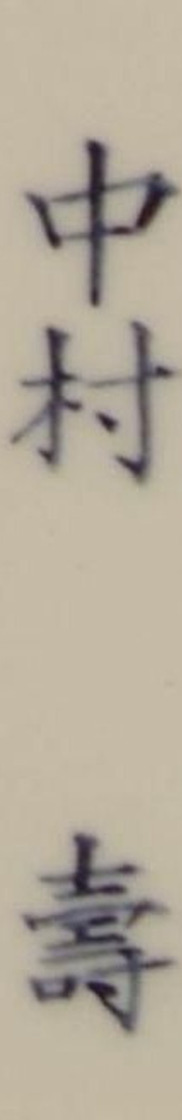中村寿
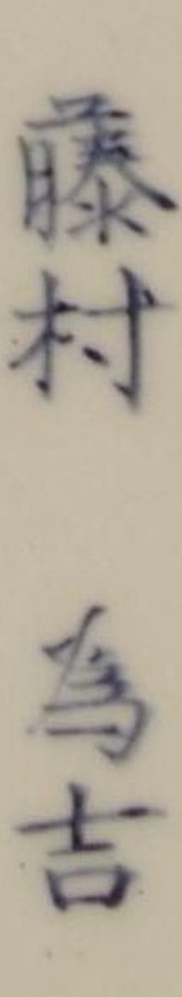藤村為吉
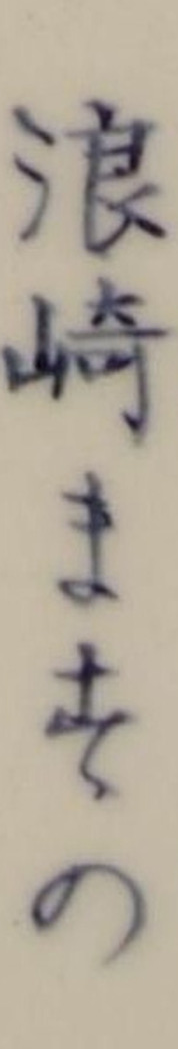浪崎ますの
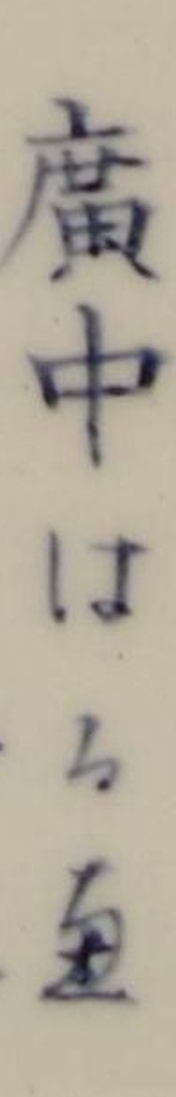広中はる通
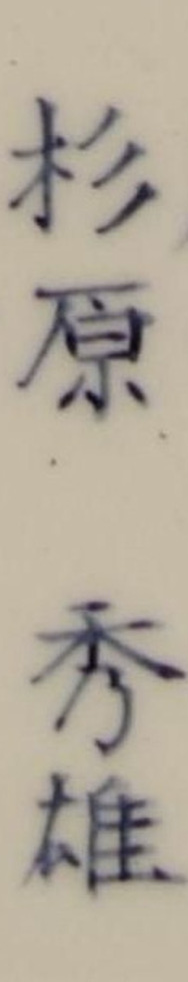杉原秀雄
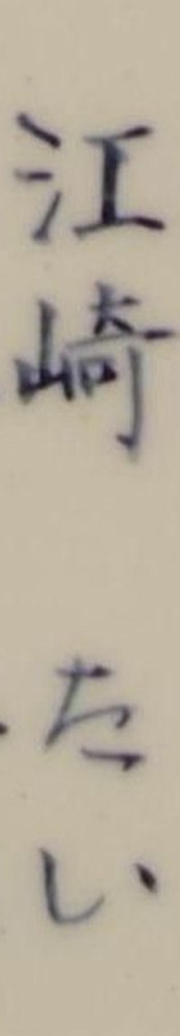江崎たい
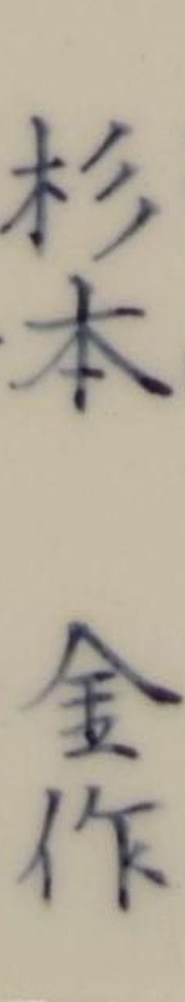杉本金作
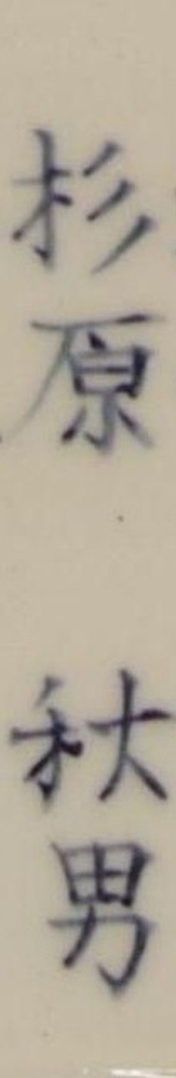杉原秋男
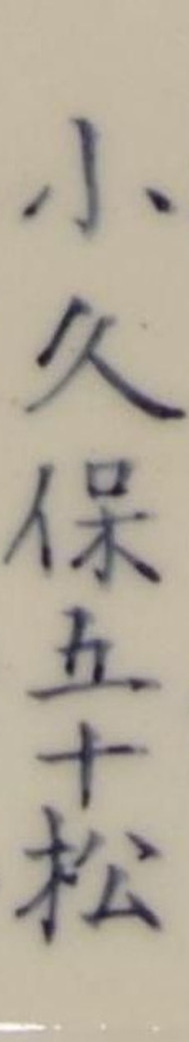小久保五十松
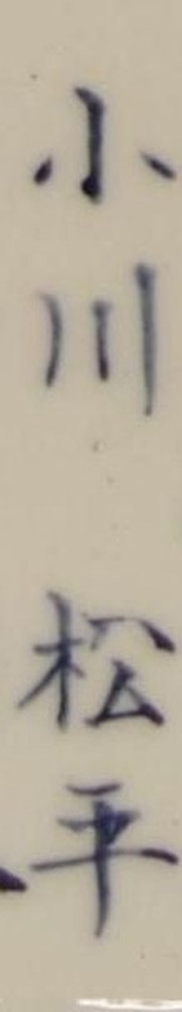小川松平
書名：E~L
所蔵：高野山金剛峯寺
